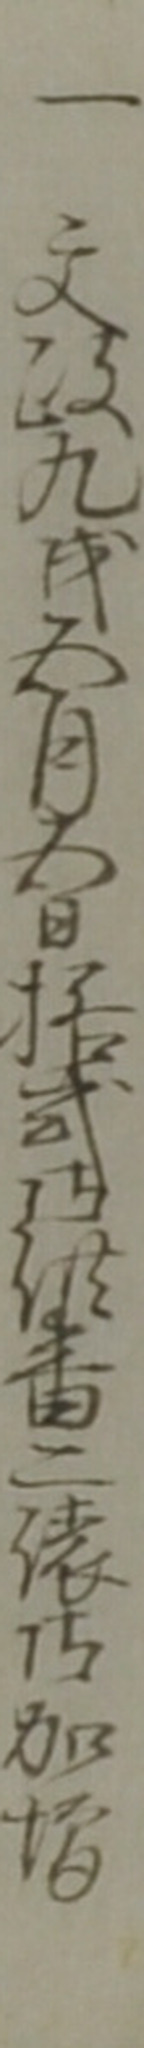一文政九戌五月五日格式御供番二俵御加増
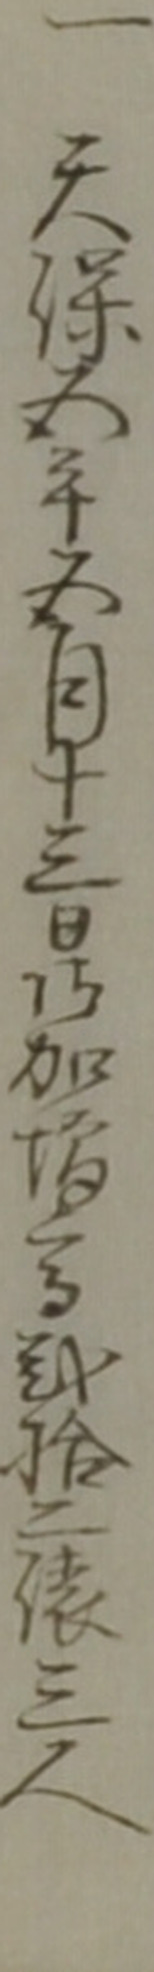一天保五午五月十三日御加増高弐拾俵三人
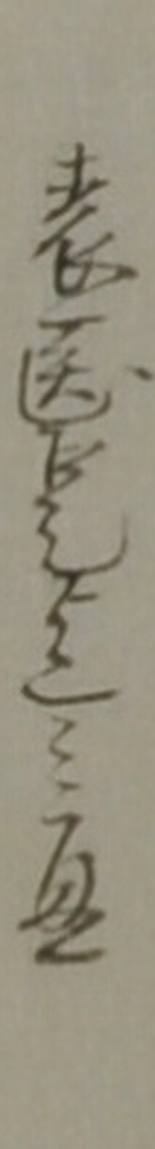表医是迄之通
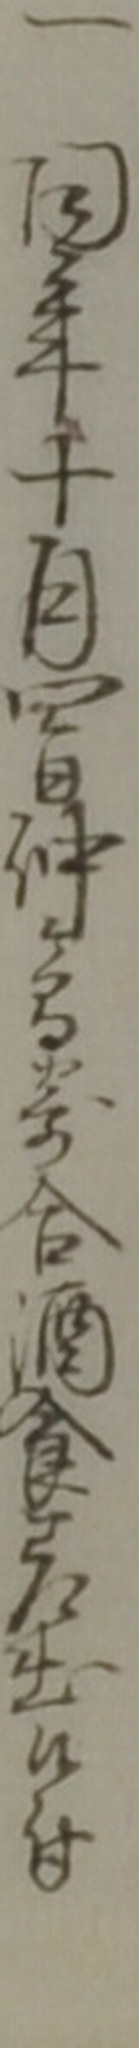一同年十月四日仲ヶ間寄合酒食差出候付
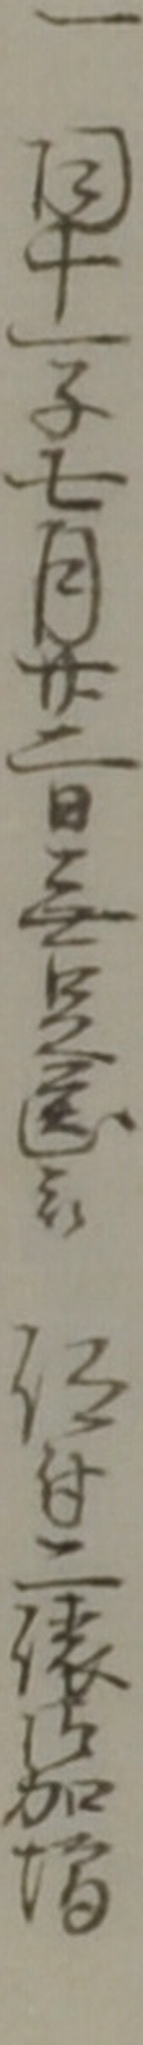一同十一子七月廿二日無足医被仰付二俵御加増
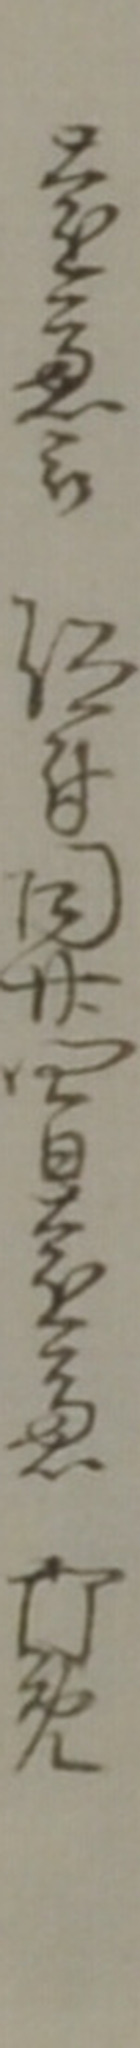遠慮被仰付同廿四日遠慮御免
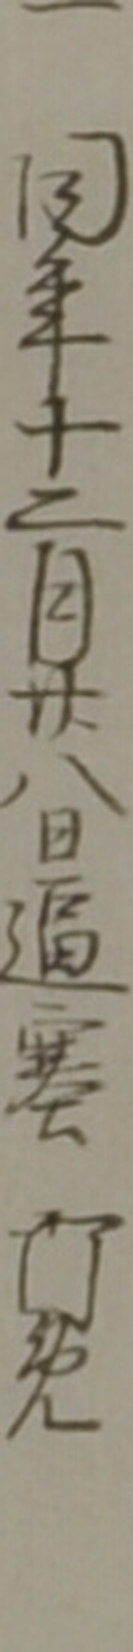一同年十二月廿八日逼塞御免
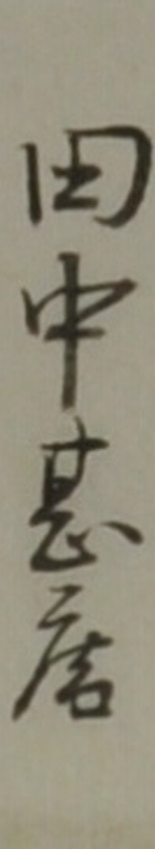田中甚庵

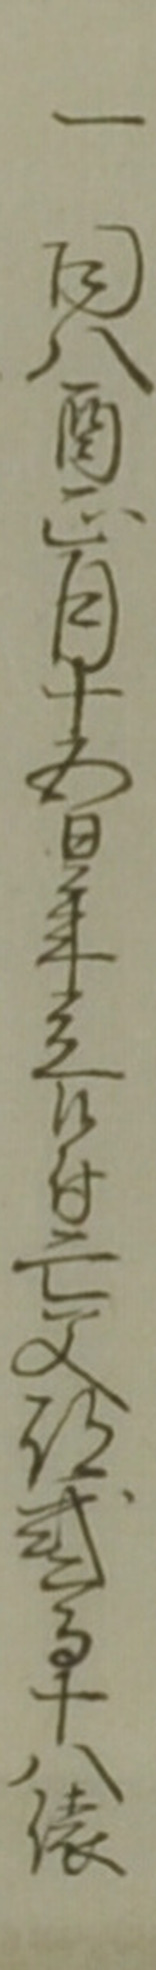一同八酉正月十五日年立候付亡父跡式高十八俵
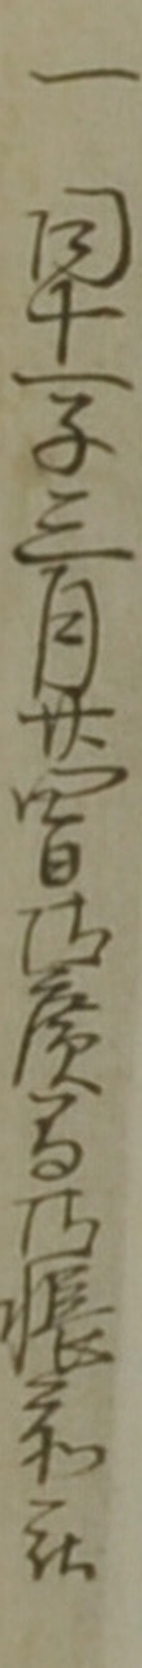一同十一子三月廿四日御広間御帳和被
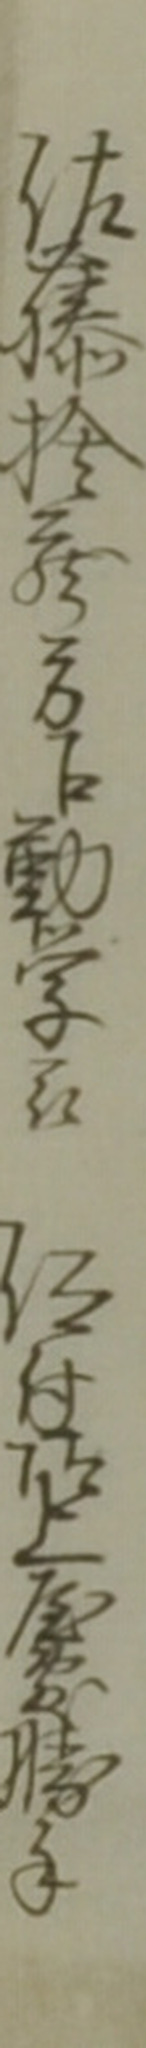佐藤捨蔵方江勤学被仰付御上屋敷勝手
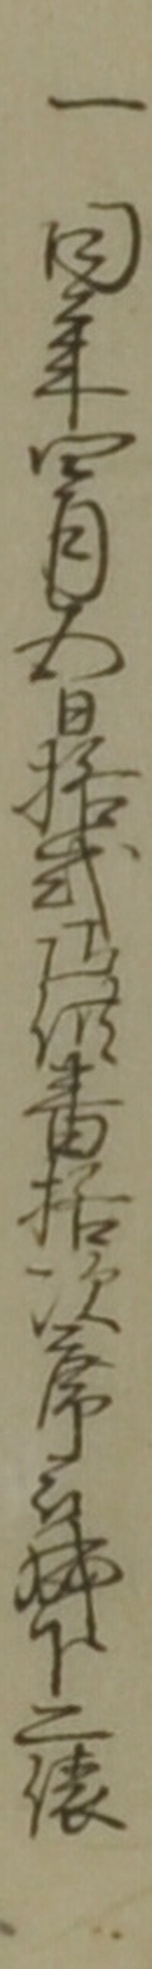一同年四月五日格式御供番格次席被成下二俵
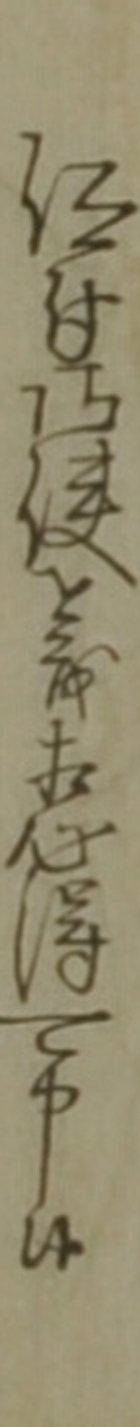仰付御使を茂相心得可申候
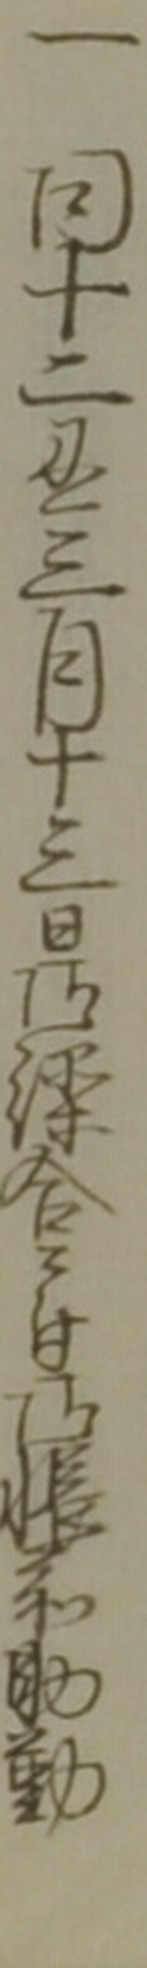一同十二丑三月十三日御繰合ニ付御帳前助勤
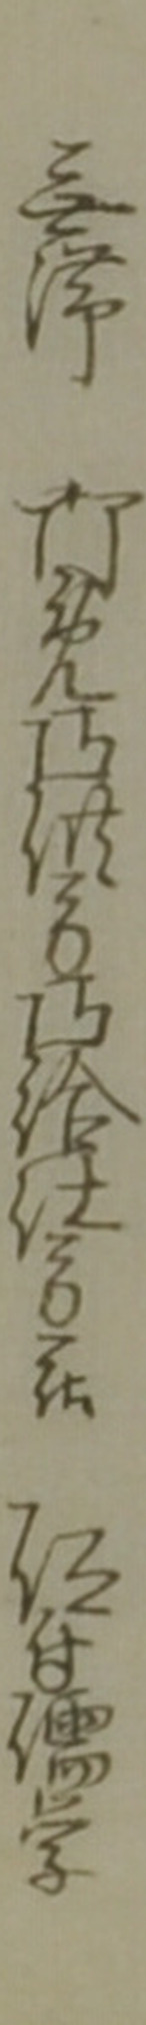無滞御免御供方御給仕方被仰付儒学
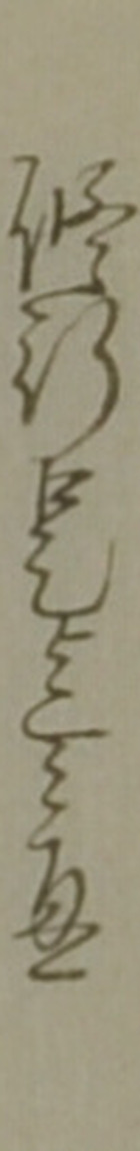修行是迄之通
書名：無足諸士勤仕録（二）
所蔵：伊那市立高遠町図書館・合同会社AMANE
